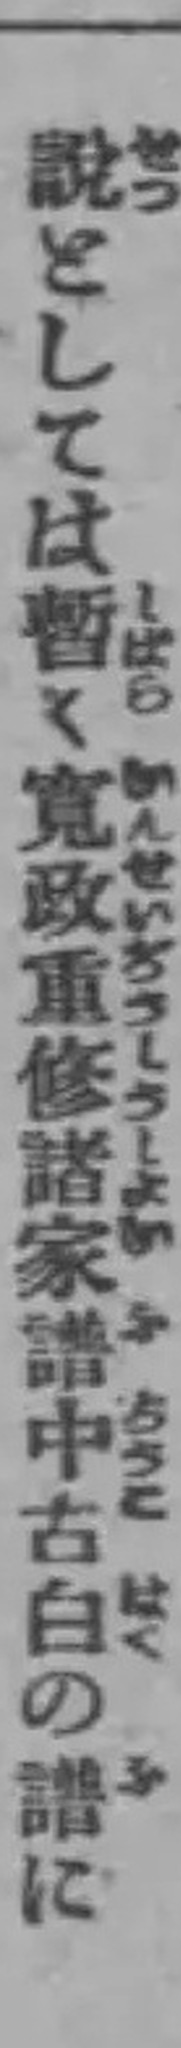説としては暫く寛政重修諸家譜中古白の譜に
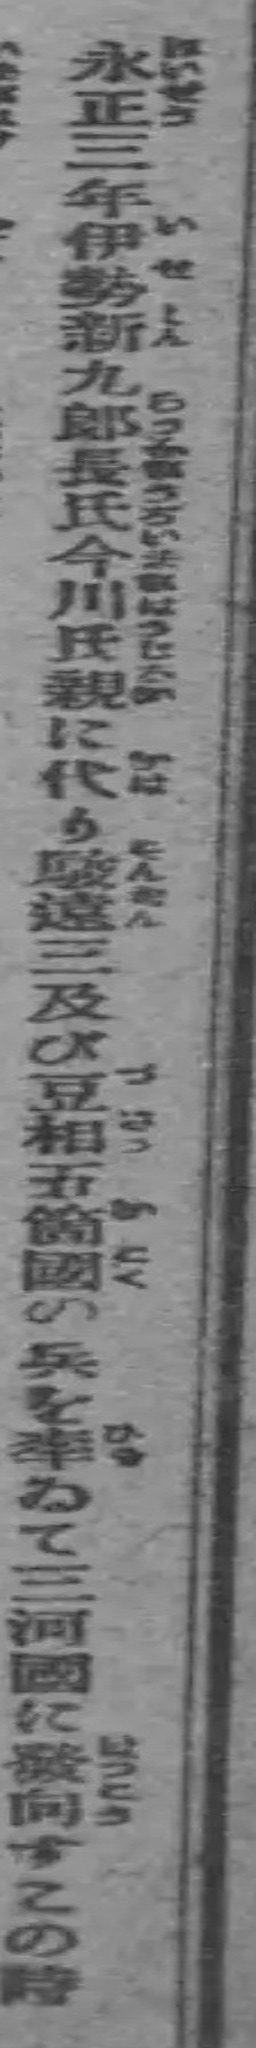永正三年伊勢新九郎長氏今川氏親に代り駿遠三及び豆相五箇国の兵を率ゐて三河国に発向す之の時
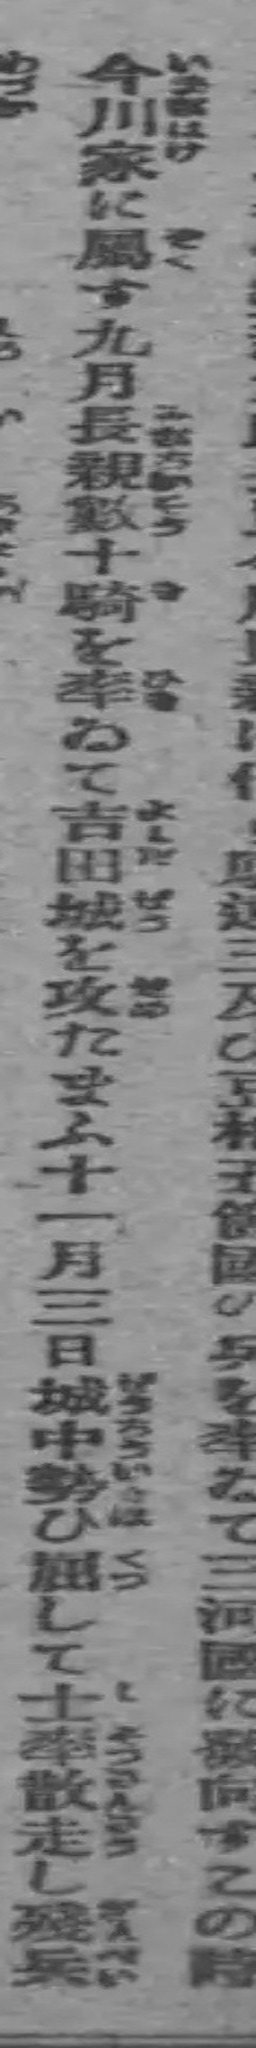今川家に属す九月長親数十騎を率ゐて吉田城を攻たまふ十一月三日城中勢ひ屈して士率散走し残兵
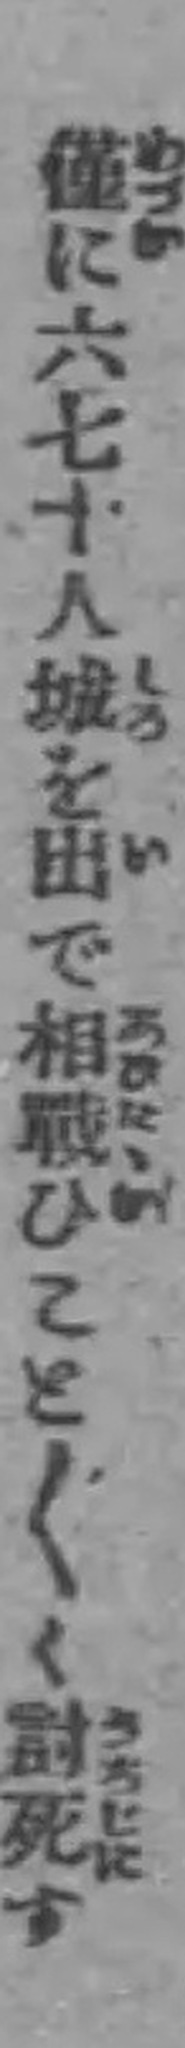僅に六七十人城を出で相戦ひこと〴〵く討死す
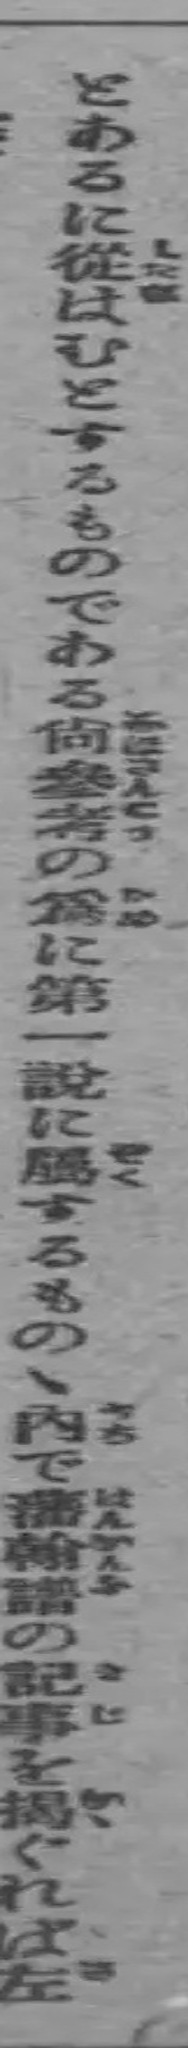とあるに従はむとするものである尚参考の為に第一説に属するものゝ内で藩翰譜の記事を掲ぐれば左
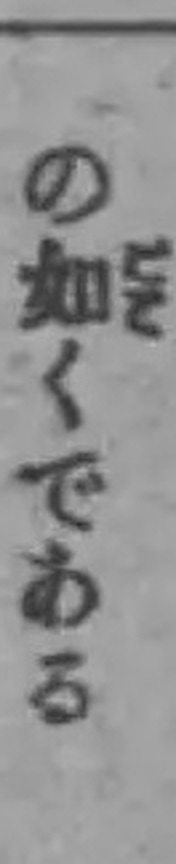の如くである
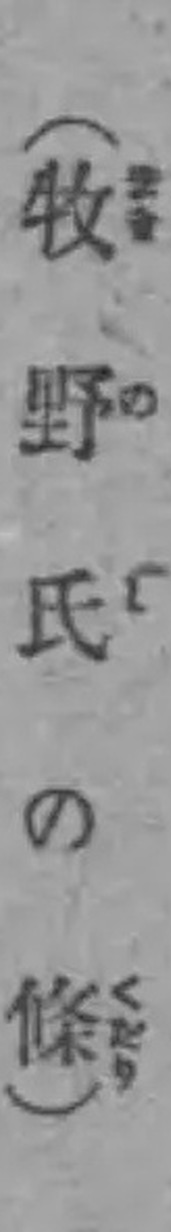(牧野氏の条)
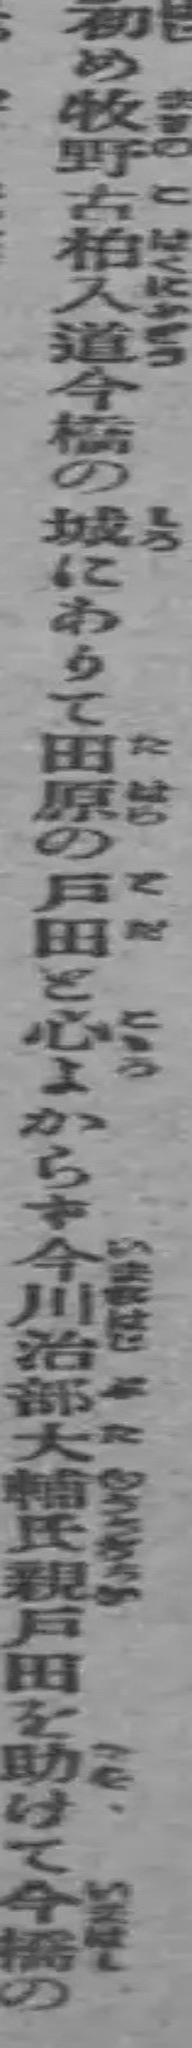初め牧野古白入道今橋の城にありて田原の戸田と心よからず今川治部大輔氏親戸田を助けて今橋の
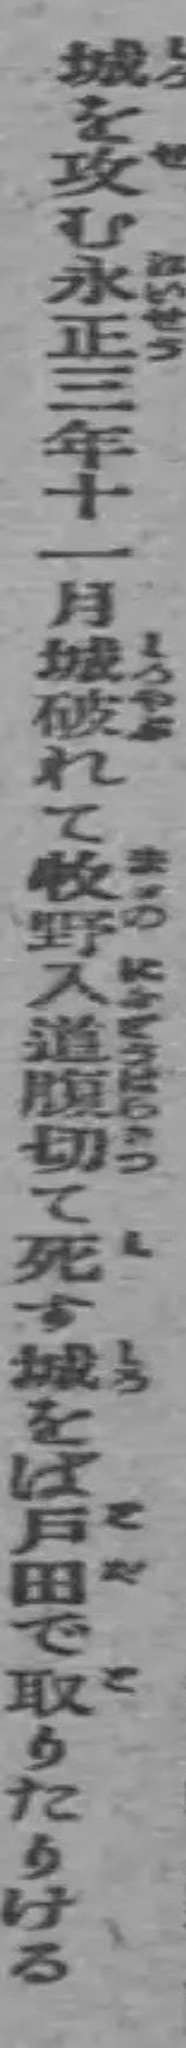城を攻む永正三年十一月城破れて牧野入道腹切て死す城をば戸田で取りたりける
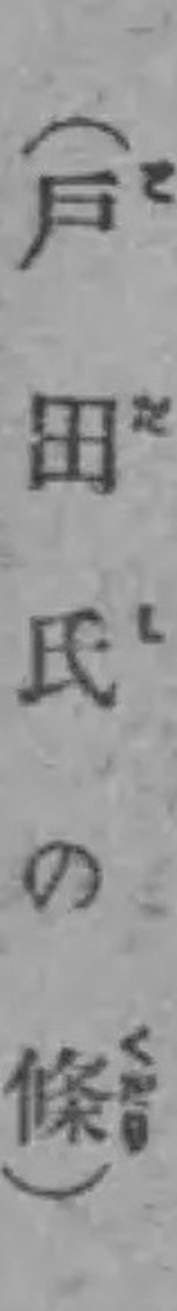(戸田氏の条)
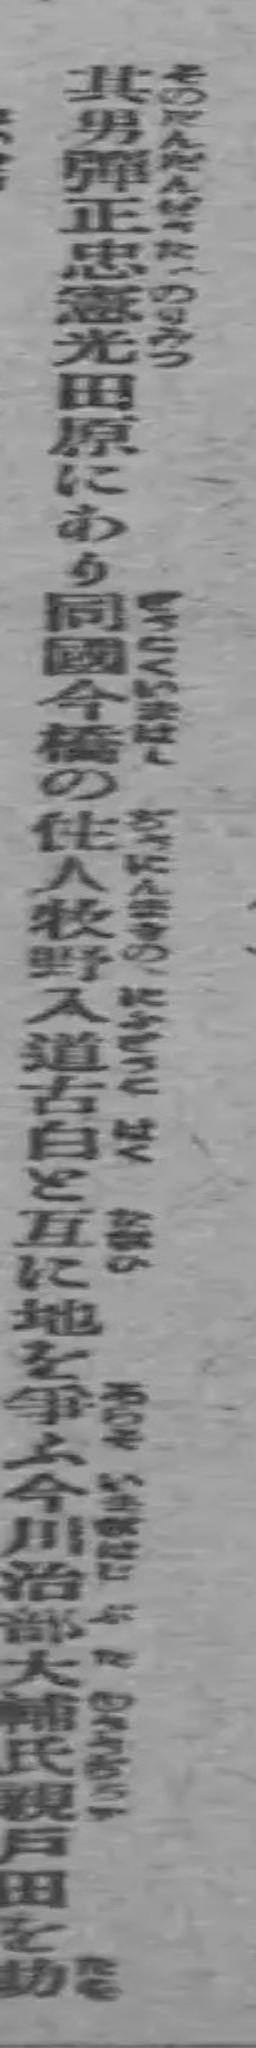其男弾正忠憲光田原にあり同国今橋の住人牧野入道古白と互に地を争ふ今川治部大輔氏親戸田を助
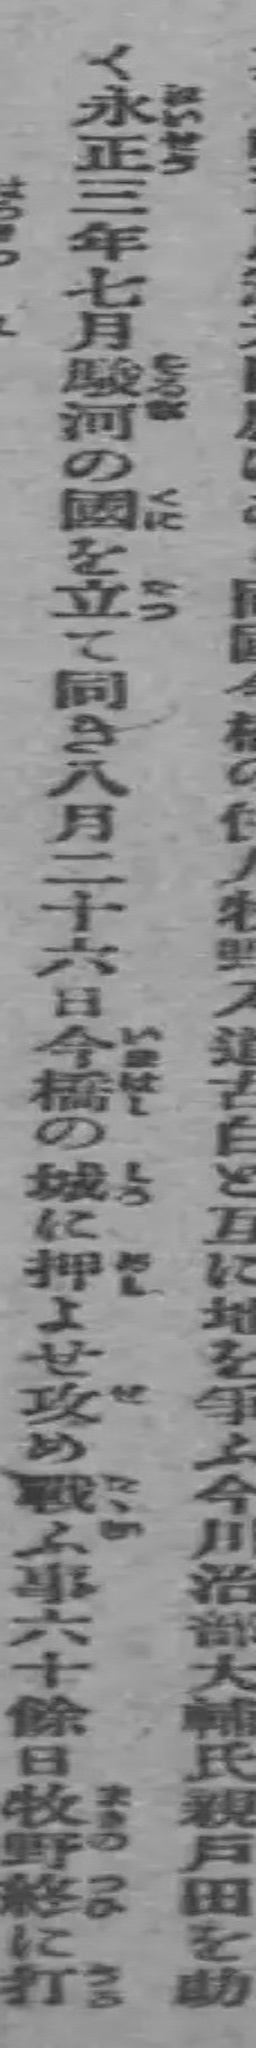く永正三年七月駿河の国を立て同き八月二十六日今橋の城に押よせ攻め戦ふ事六十余日牧野終に打
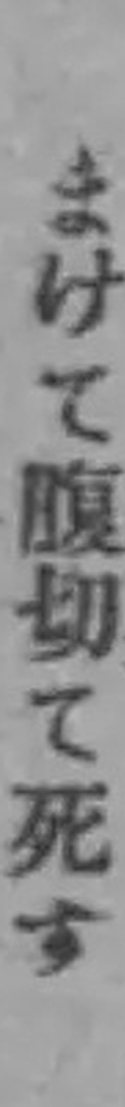まけて切腹て死す
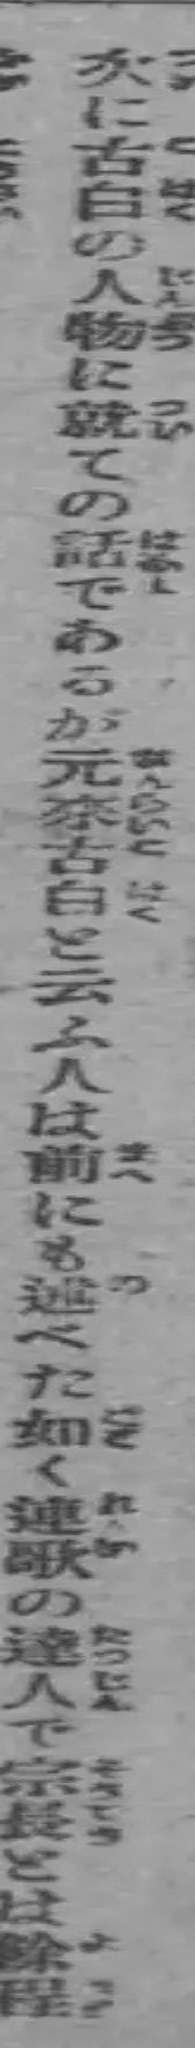古白の人物次に古白の人物に就ての話であるが元来古白と云ふ人は前にも述べた如く連歌の達人で宗長とは余程
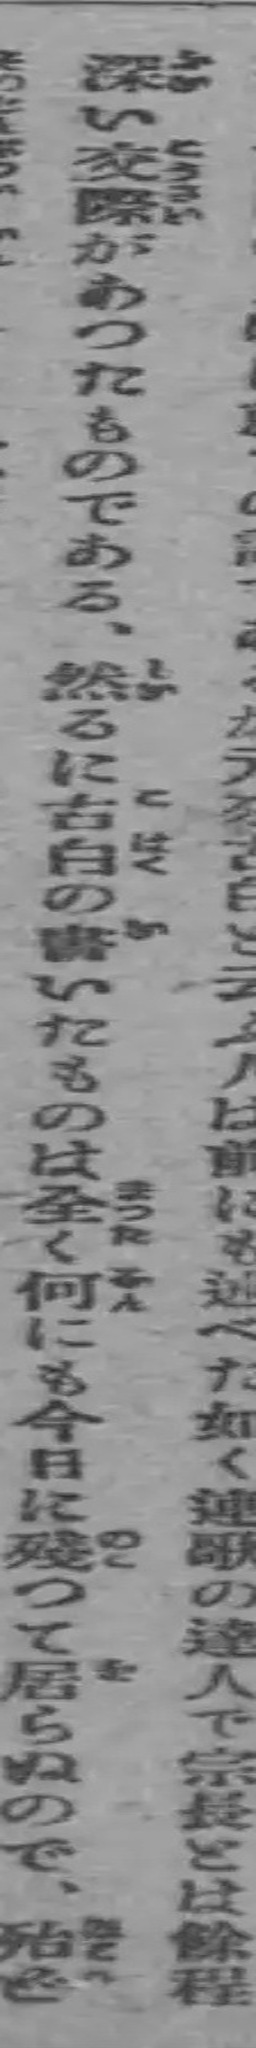深い交際があつたものである、然るに古白の書いたものは全く何にも今日に残つて居らぬので、殆ど
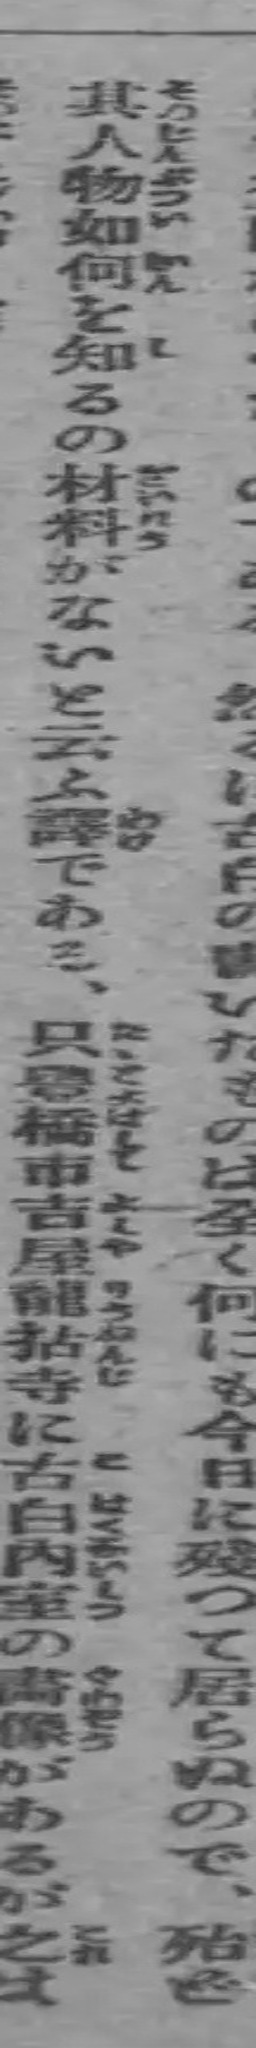其人物如何を知るの材料がないと云ふ訳である、只豊橋市吉屋龍拈寺に古白内室の画像があるが之は
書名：豊橋市史談
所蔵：国立国会図書館 National Diet Library, JAPAN
